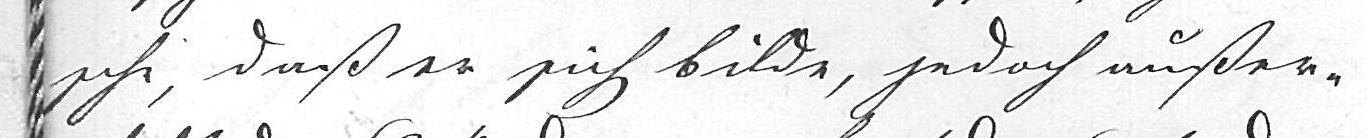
sche, daß er sich bilde, jedoch außer-
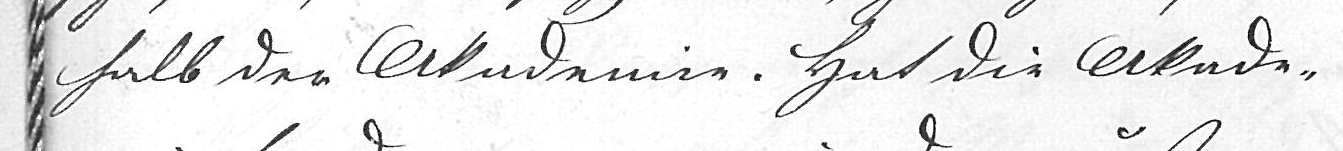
halb der Akademie. Hat die Akade-
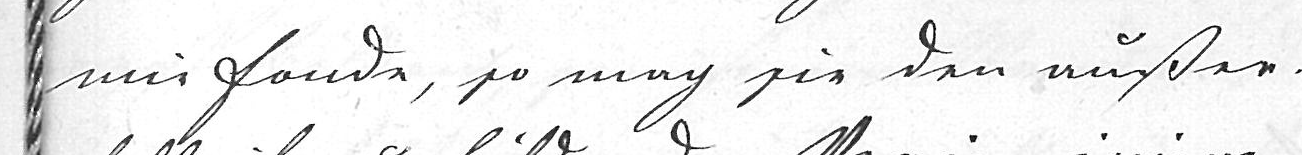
mie Fonde, so mag sie den außer-
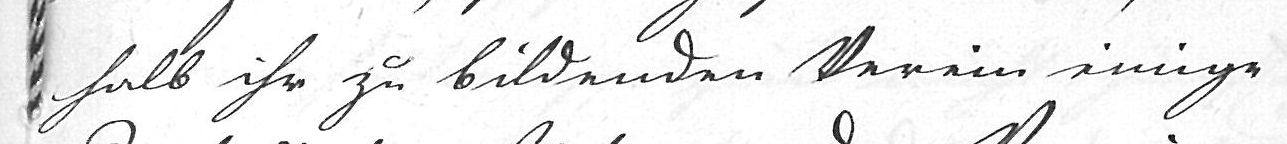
halb ihr zu bildenden Verein einige
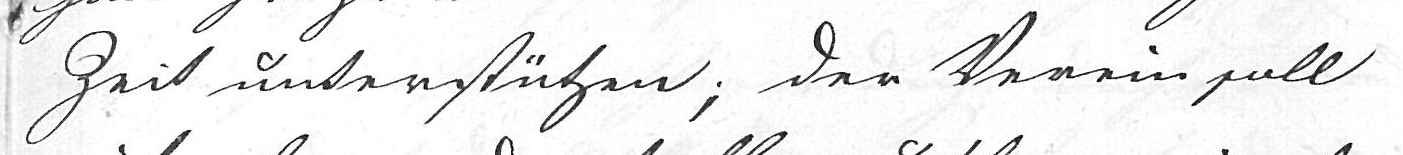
Zeit unterstützen; der Verein soll
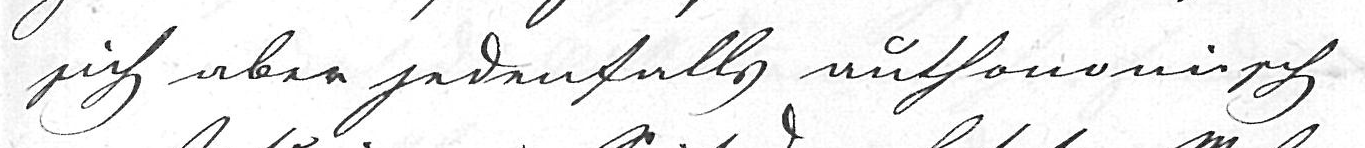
sich aber jedenfalls authonomisch
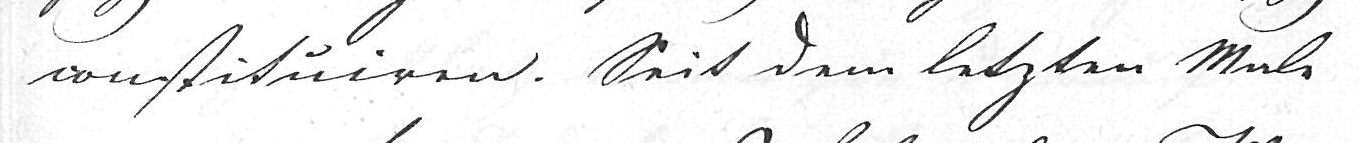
sonstituiren. Seit dem letzten Male
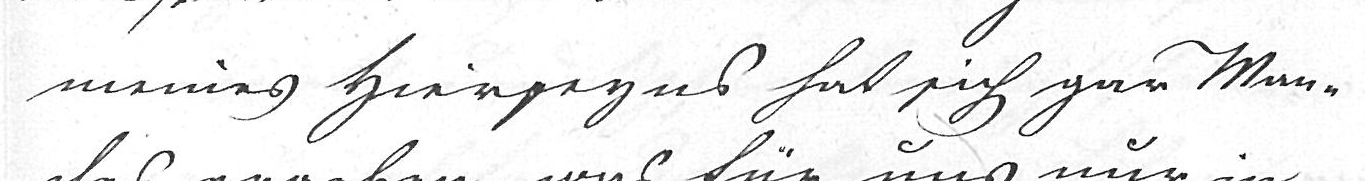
meines Hierseyns hat sich gar Man-
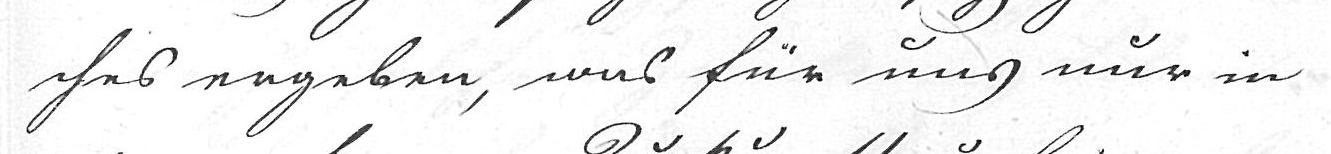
ches ergeben, was für uns nur in
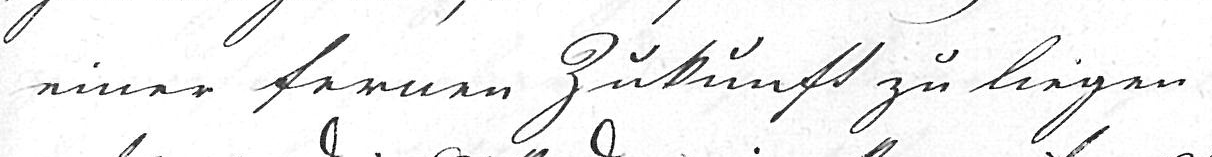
einer fernen Zukunft zu liegen
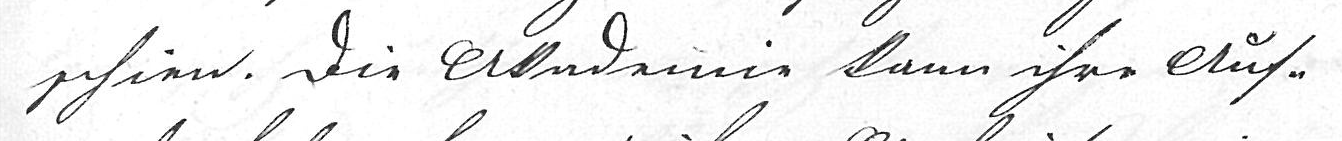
schien. Die Akademie kann ihre Auf-
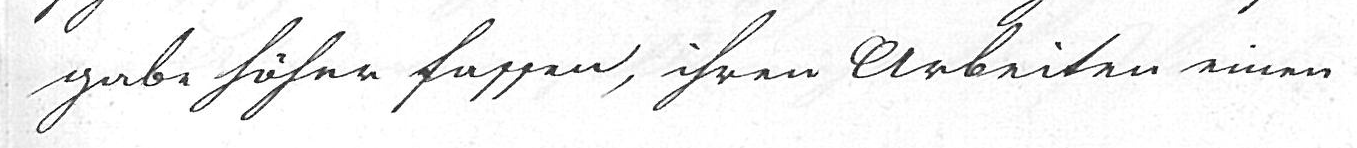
gabe höher fassen, ihren Arbeiten einen
